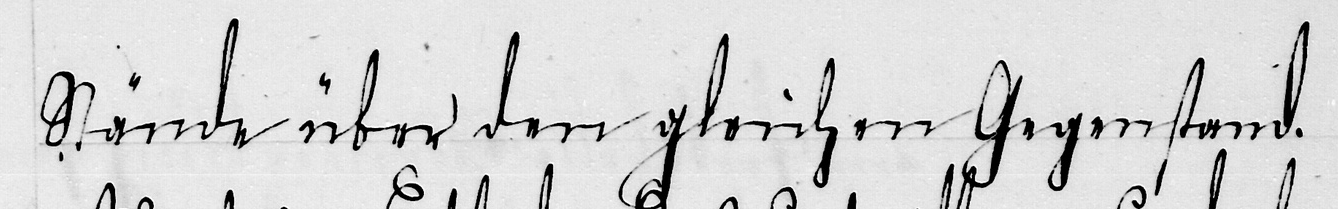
Stände über den gleichen Gegenstand.
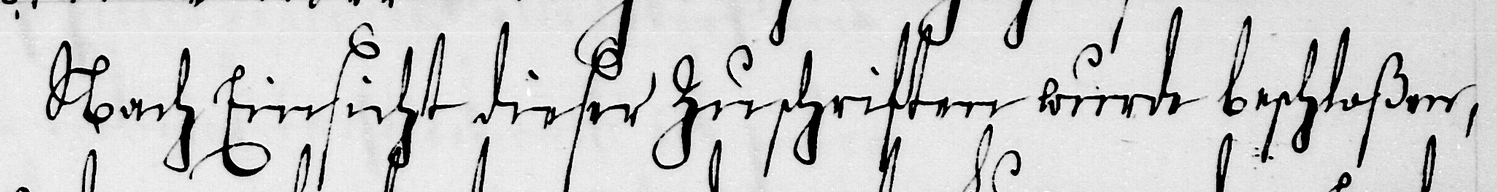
Nach Einsicht dieser Zuschriften wurde beschloßen,
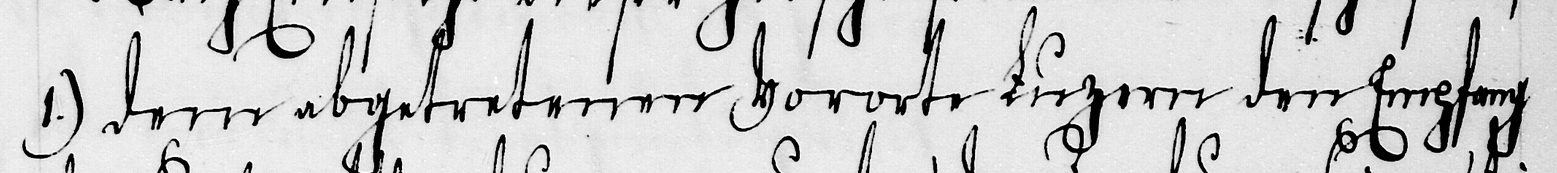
1.) dem abgetretenen Vororte Luzern den Empfang
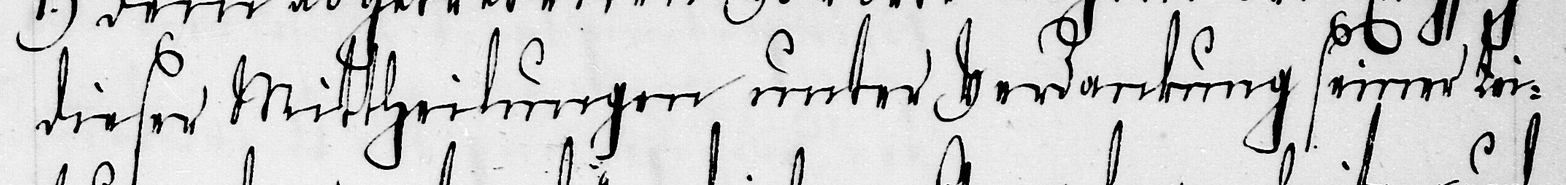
dieser Mittheilungen unter Verdankung seiner Lei¬
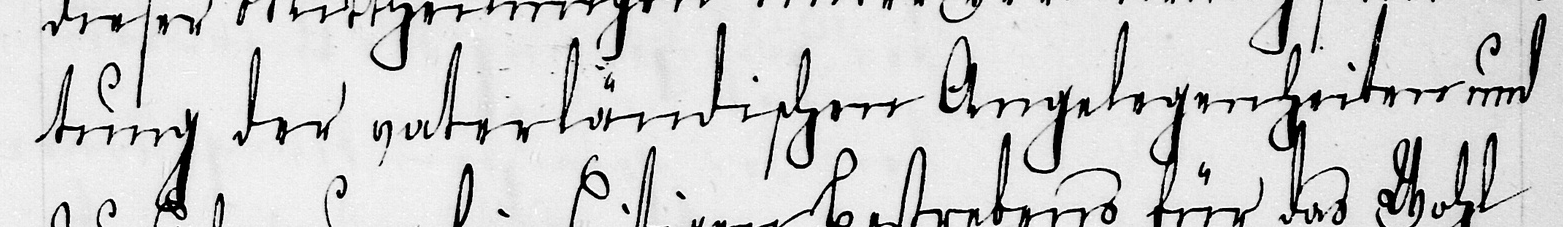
tung der vaterländischen Angelegenheiten und
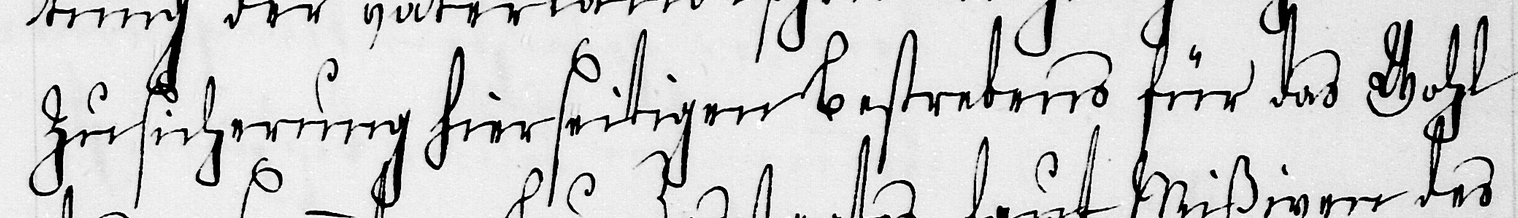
Zusicherung hierseitigen Bestrebens für das Wohl
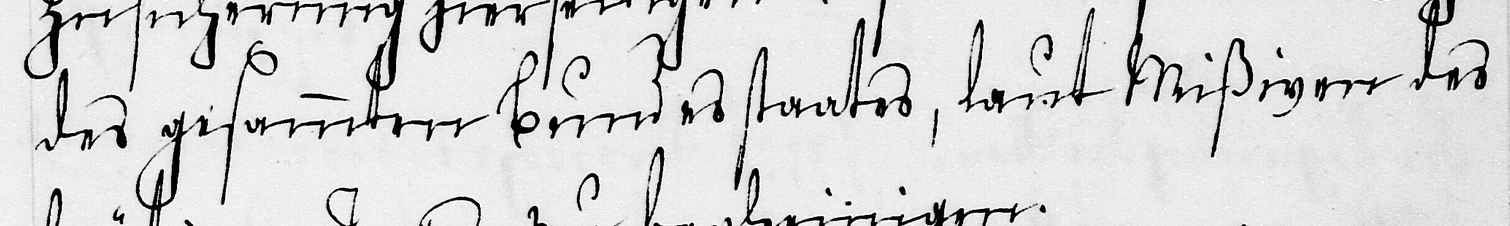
des gesammten Bundesstaates, laut Mißiven des
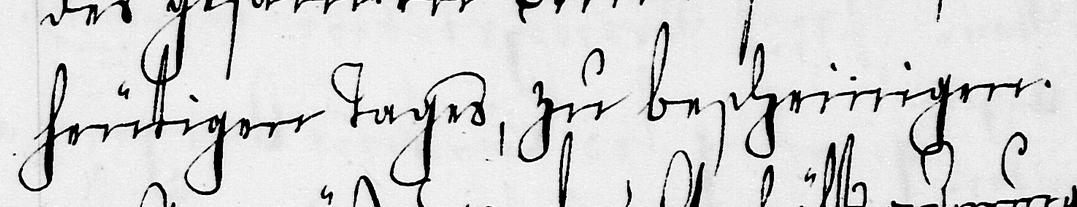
heutigen Tages, zu bescheinigen.
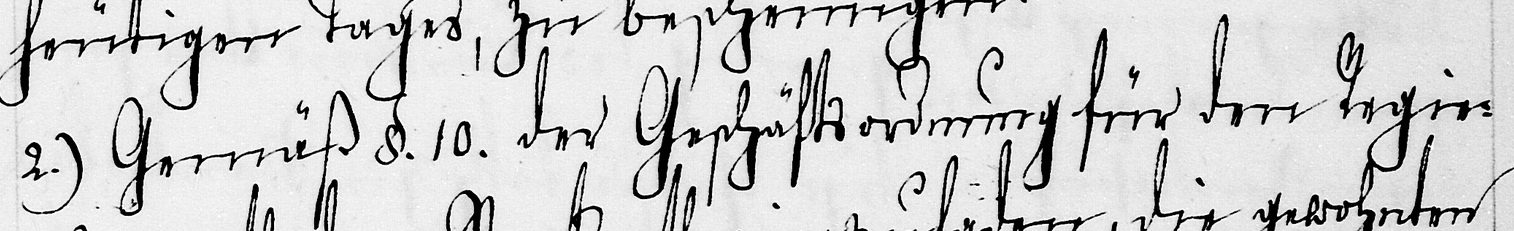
2.) Gemäß §. 10. der Geschäftsordnung für den Regie¬
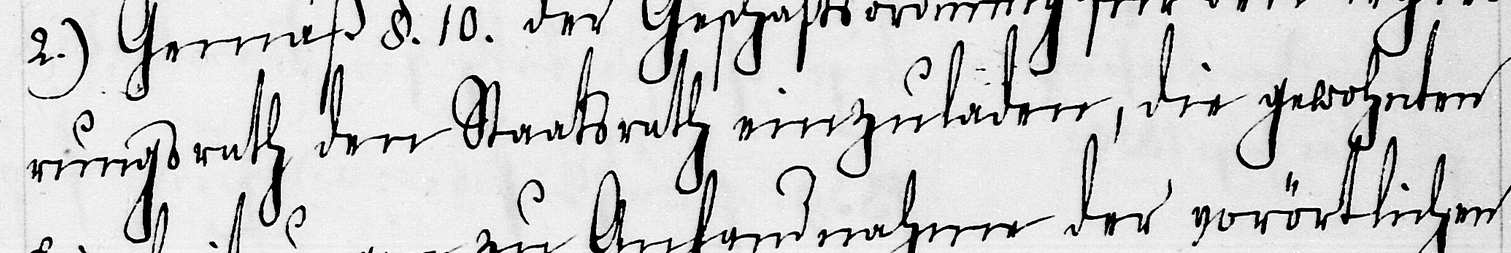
rungsrath den Staatsrath einzuladen, die gewohnten
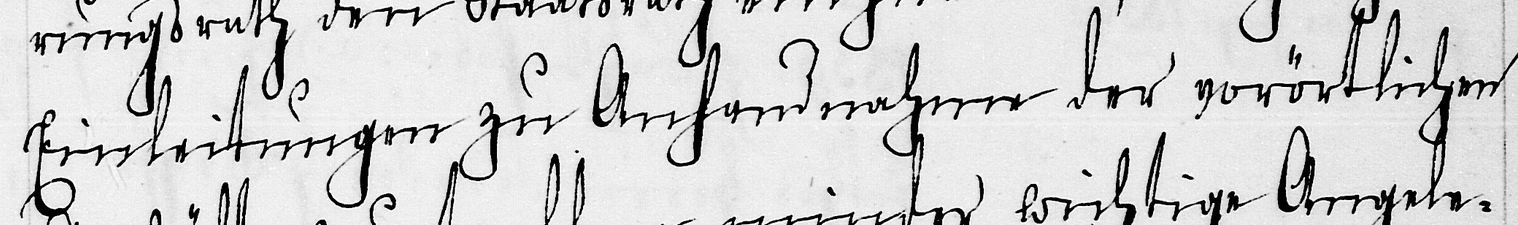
Einleitungen zu Anhandnahme der vorörtlichen
